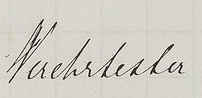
Verehrtester
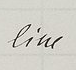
Freund.
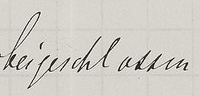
beigeschlossen eine
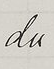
des
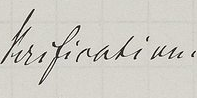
Telegramms über
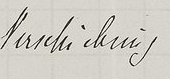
Verschiebung der
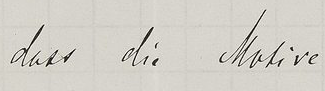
dass die Motive
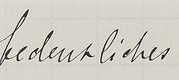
bedenkliches
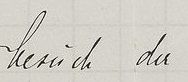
Besuch der
